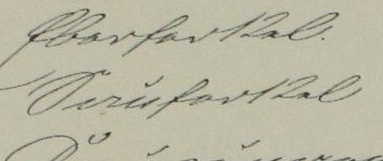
Sauferkel
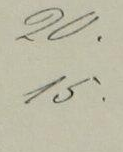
15
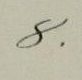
8
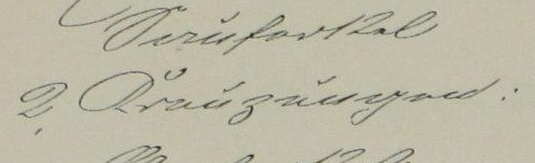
2. Kreuzungen:
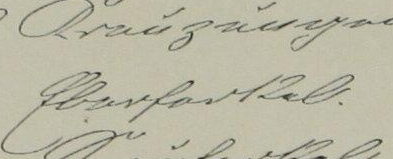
Eberferkel
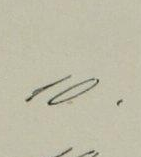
10
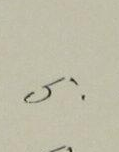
5
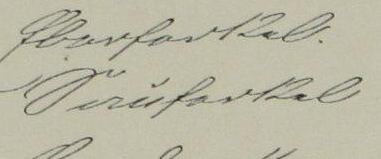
Sauferkel
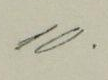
10
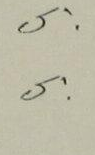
5
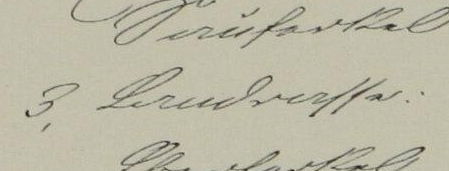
3. Landrasse:
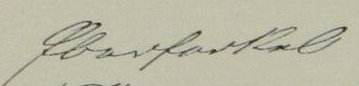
Eberferkel
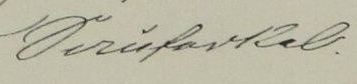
Sauferkel
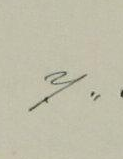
7
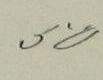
50
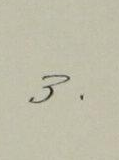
3
